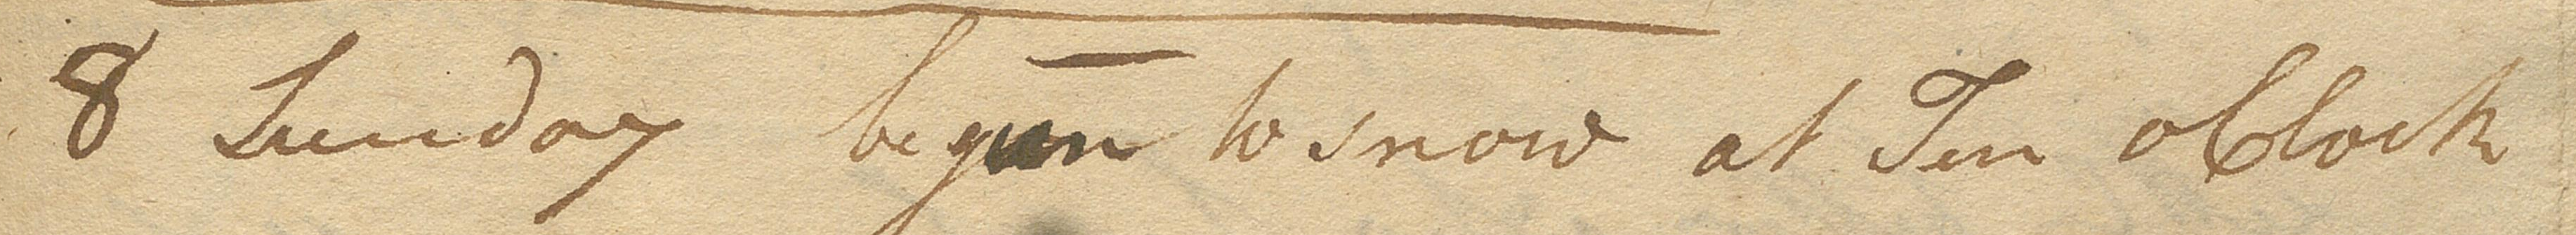8 Sunday begun to snow at Ten oClock
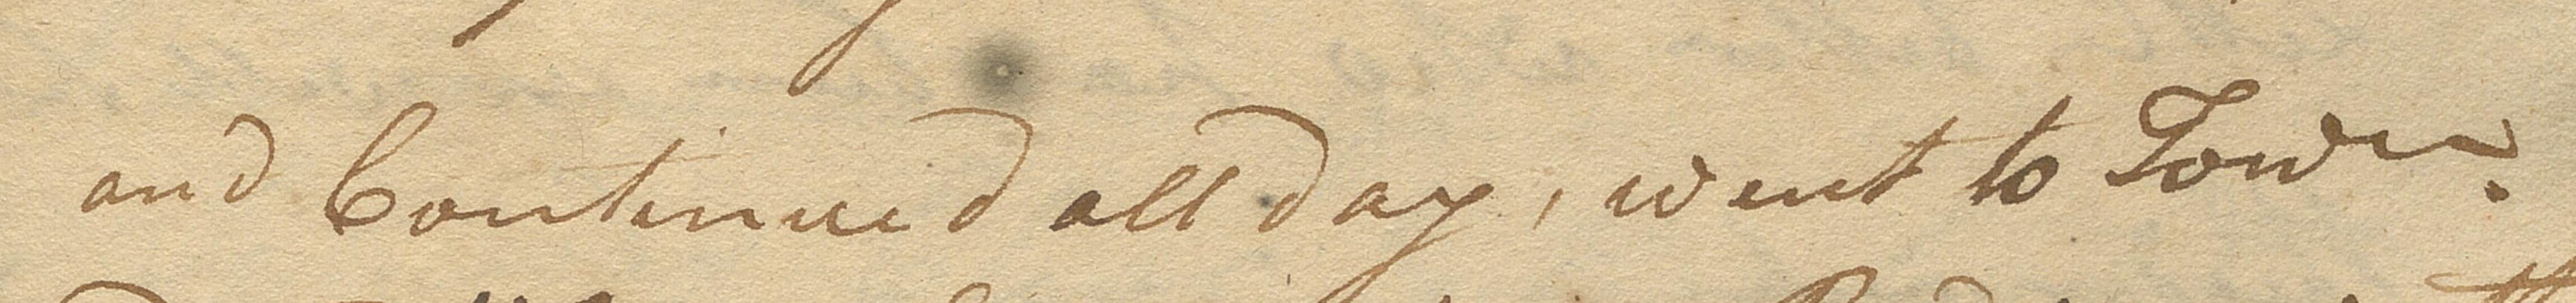and Continued all day, went to Town
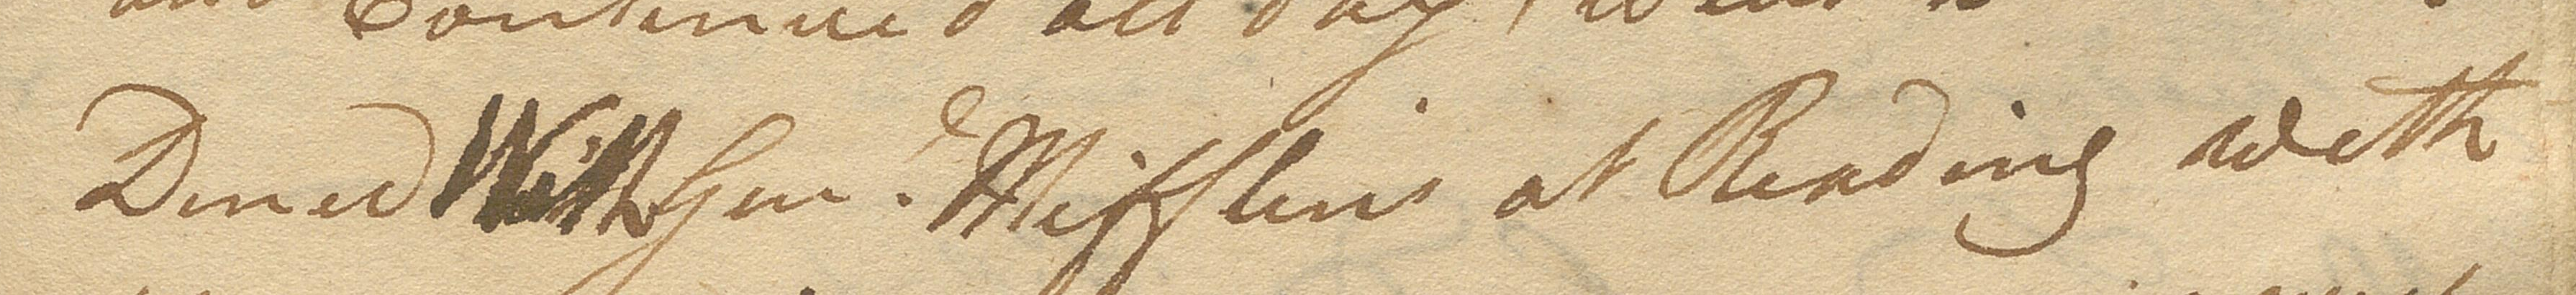Dined With Gen^l. Mifflins at Reading with
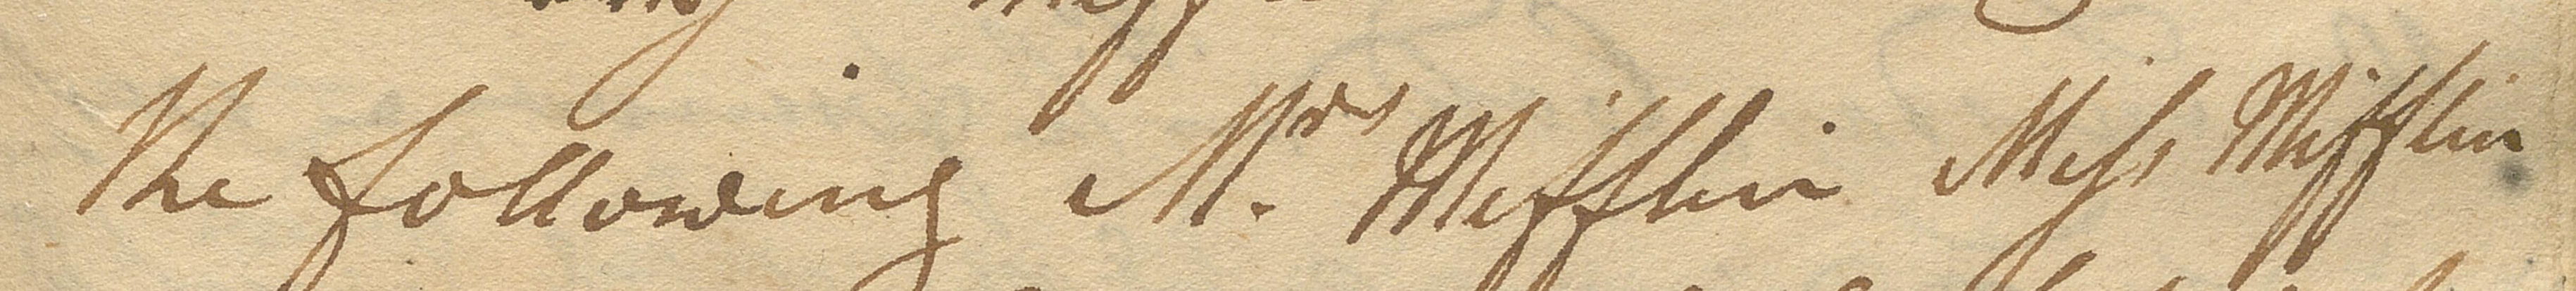the following M^rs. Mifflin Mess Mifflin
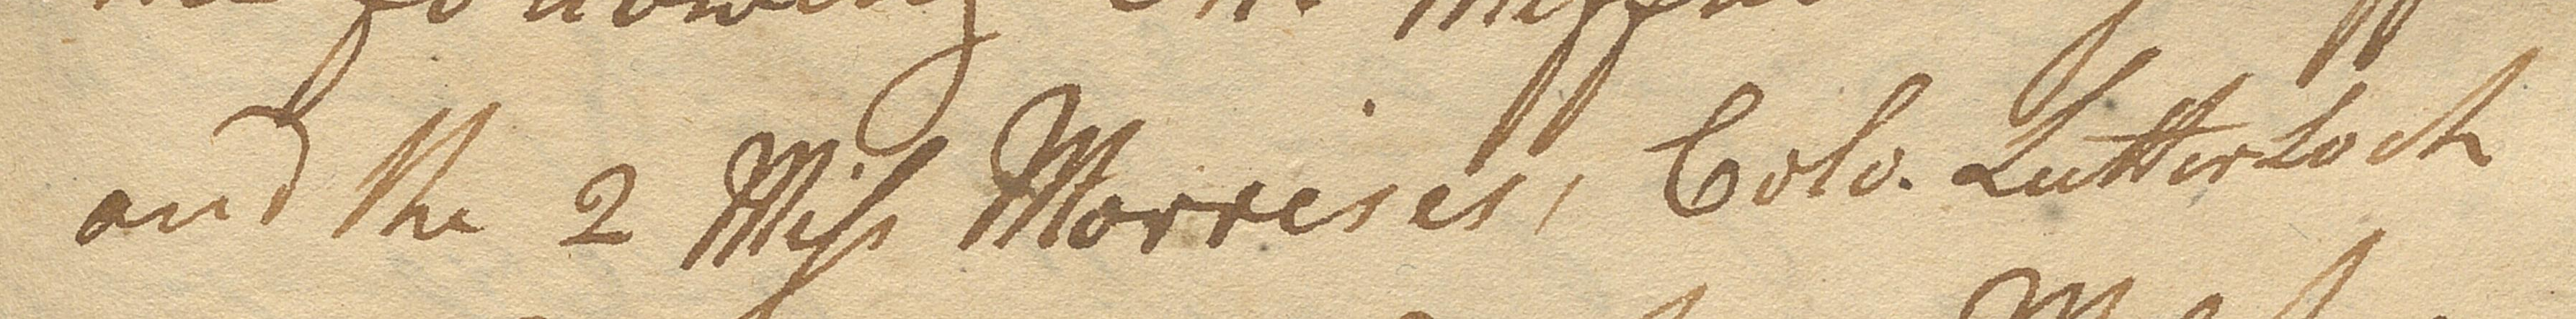ant the 2 Miss Morrises, Colo. Lutterlock
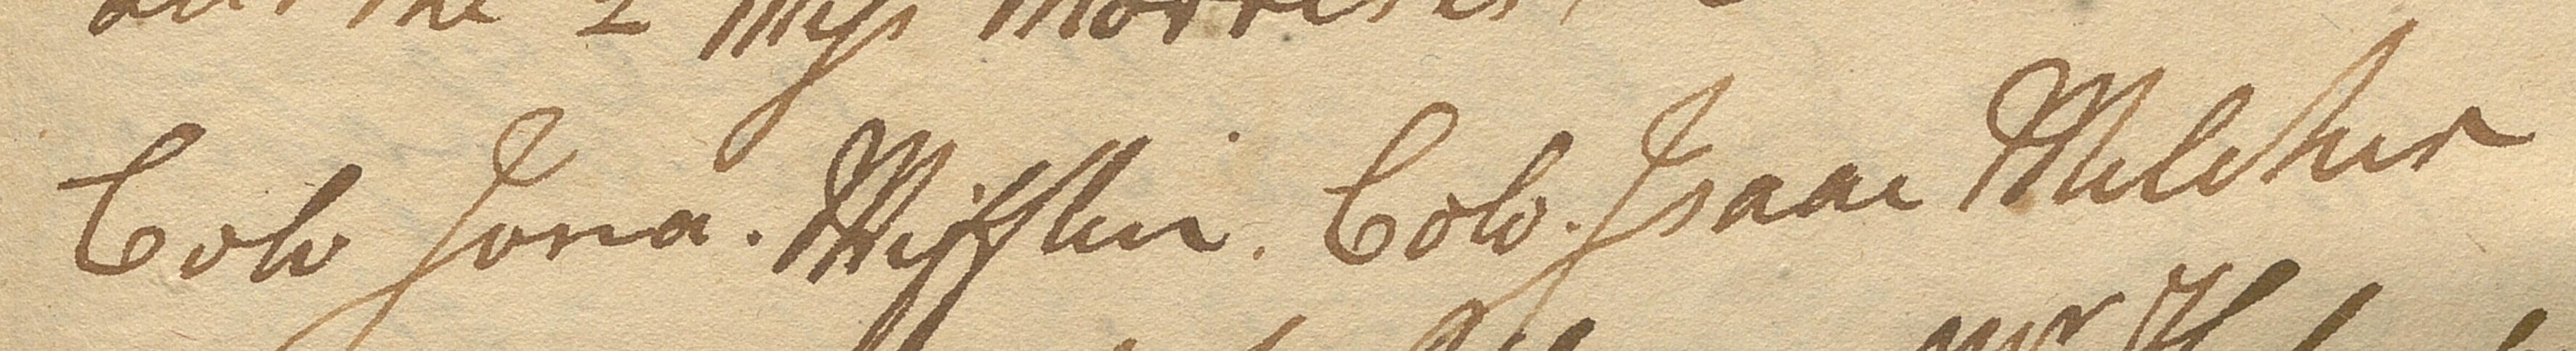Colo Jona. Mifflin, Colo. Isaac Melcher
